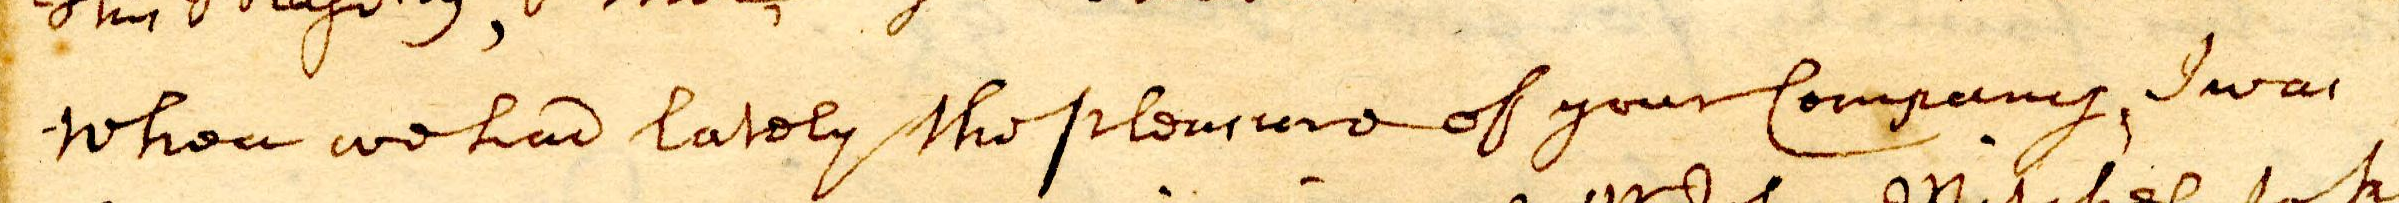When we had lately the pleasure of your Company, I was
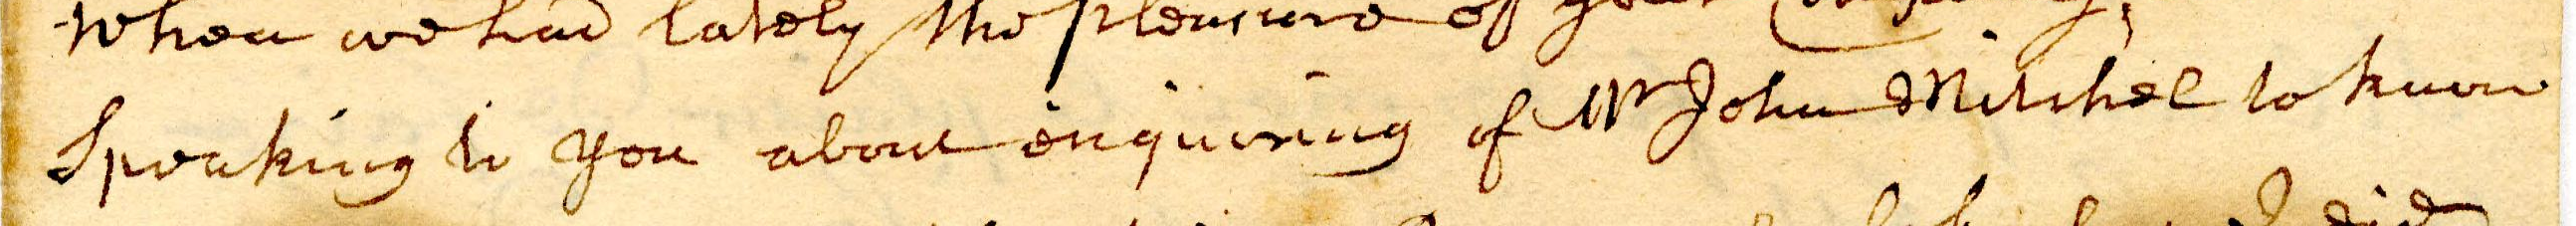speaking to you about inquiring of M^r John Mitchel to know
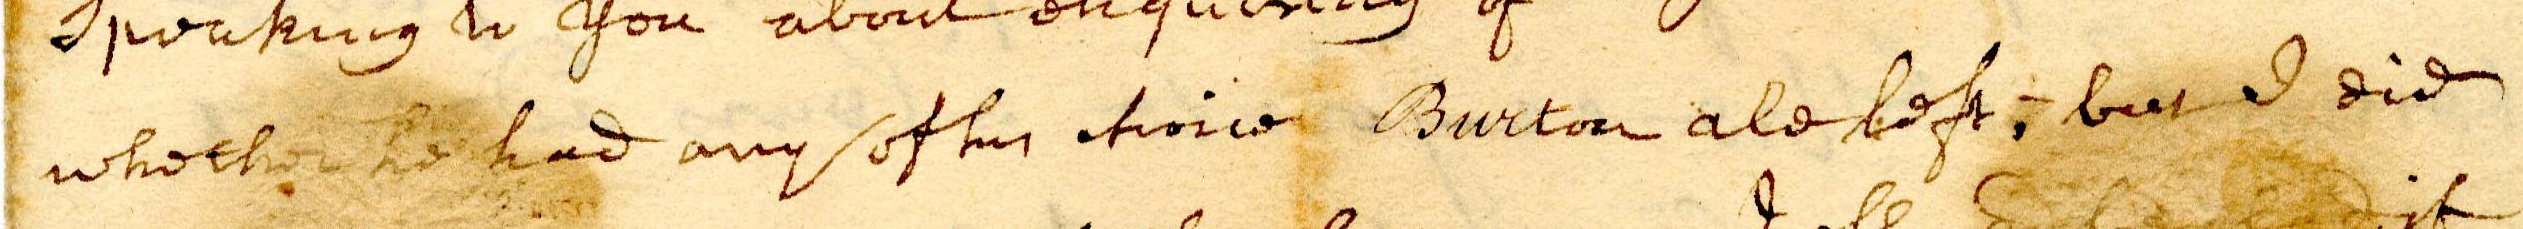whether he had any of his choice Burton ale left, but I did
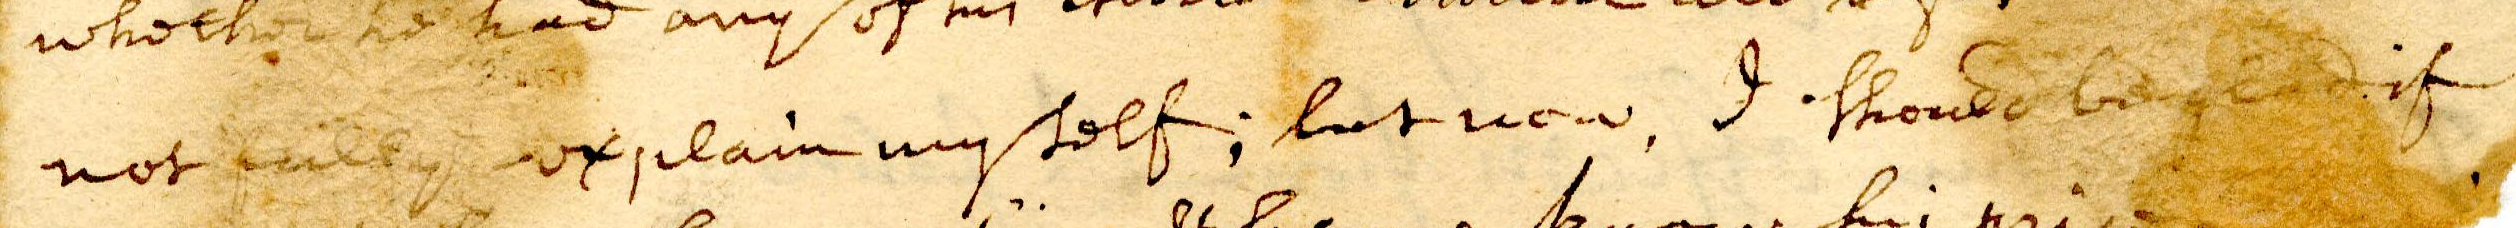not really explain my self; but now, I should be glad if
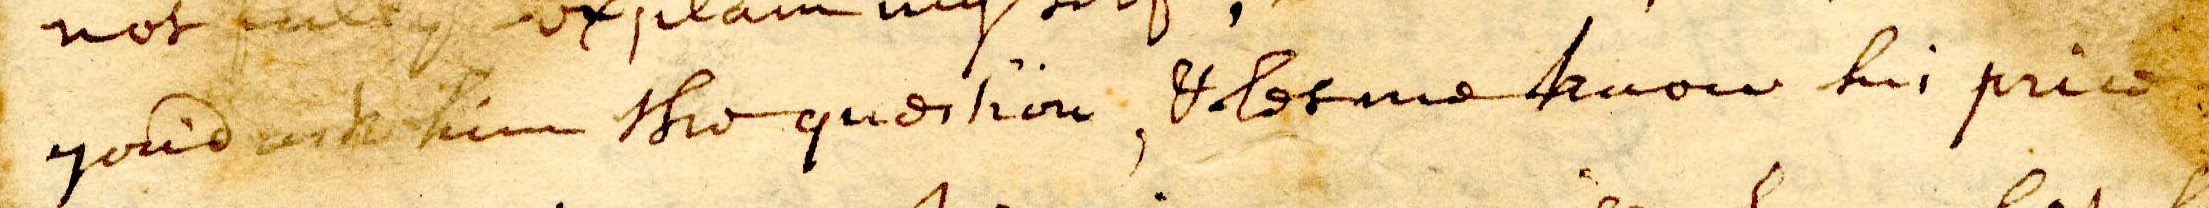you'd ask him the question, & let me know his price
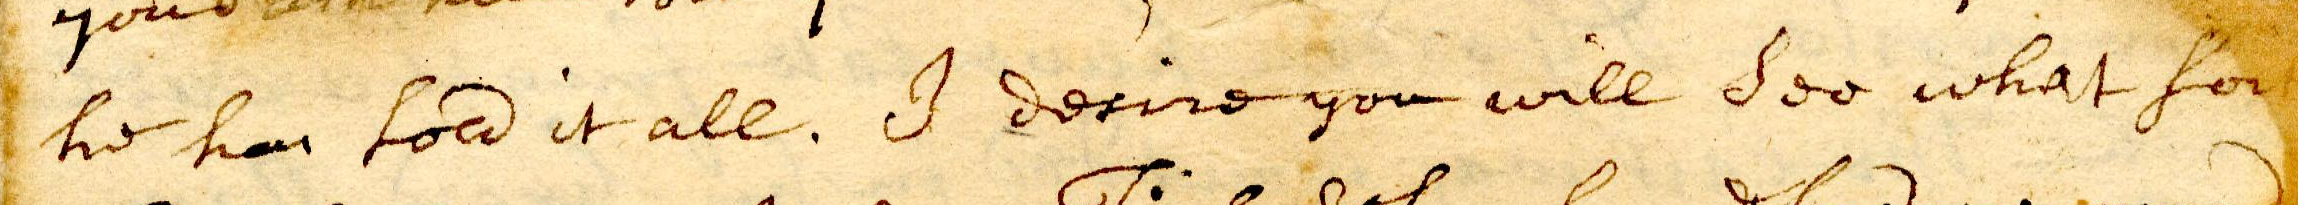he has sold it all. I desire you will see what for
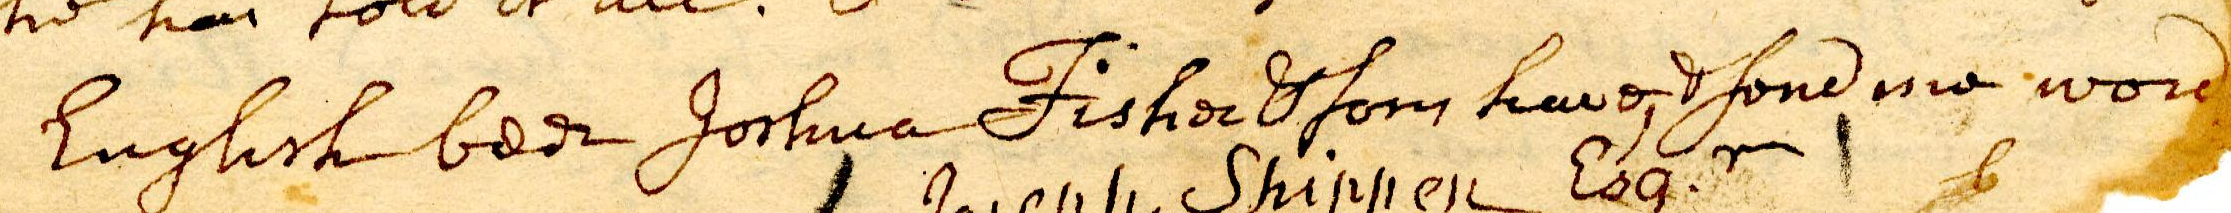English for Joshua Fisher & son] have, & send new word
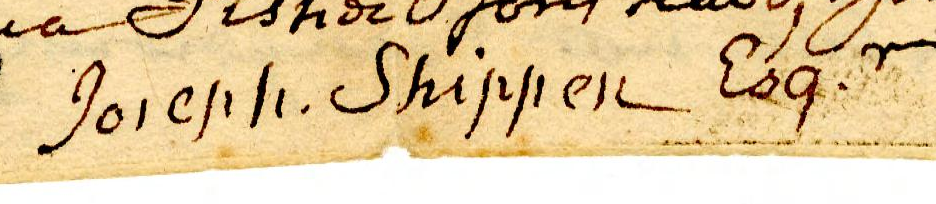Joseph. Shippen Esq.^r
